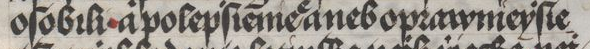oſobili.a polepẛiemeea neb oprawnieyẛie
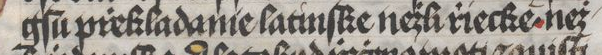gſu pṙekladaníe latinſke neżli ṙíecke.neż¬
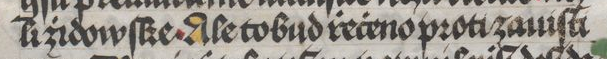li żidowſke.Ale tobud ṙeċeno proti zauiſti
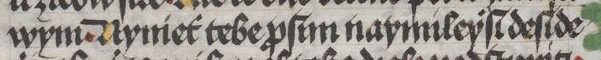wym.Nyníeṫ tebe ꝓſim naymileyẛi deſide¬
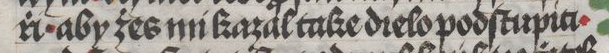ṙí.aby żes mi kazal take dielo podſtupiti.
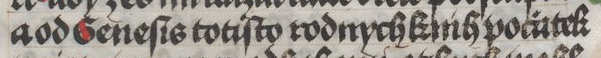a od Geneſis totiẛto rodnychkníh počatek
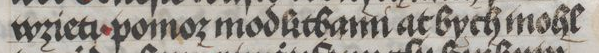wzieti.pomoz modlitbami at bych mohl
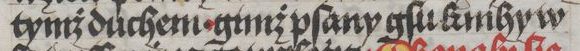tymż duchem.gímż pſany gſu knihy w
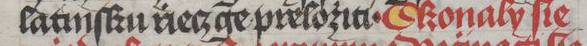latinſku ṙiecz ge prelożiti.Skonaly ſíe
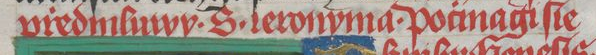pṙedmluwy.S.ieronyma.Poċínagi ſíe
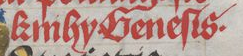knihy Geneſis.
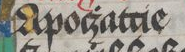Apocżatcíe
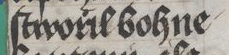ſtwoṙil bohne¬
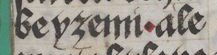be yzemi.ale
